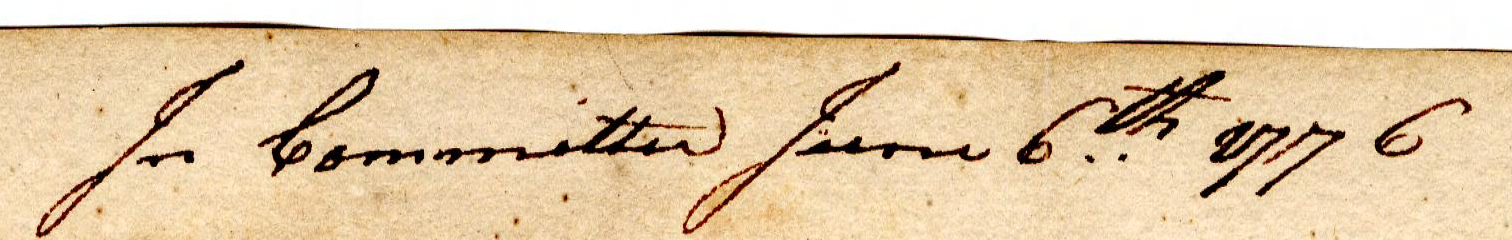In Committee June 6^th. 1776
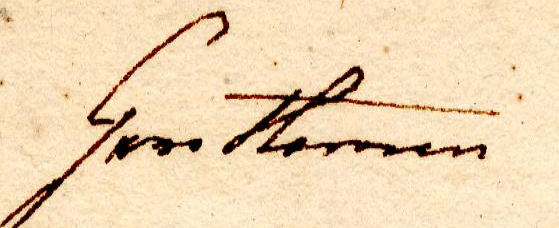Gentlemen
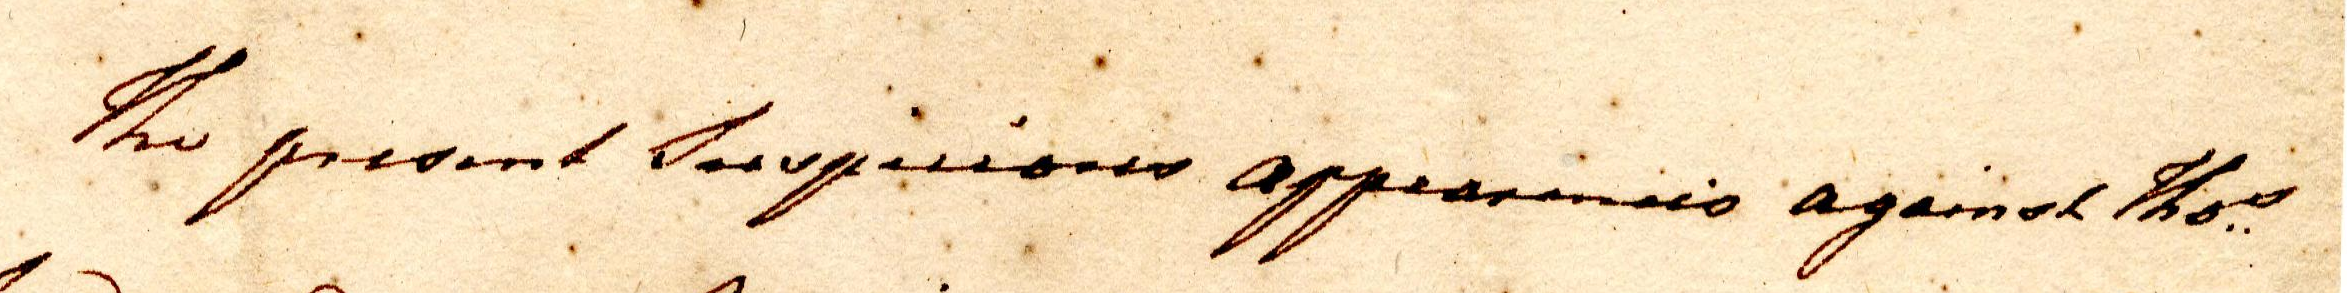The present suspicious appearances against Tho^s.
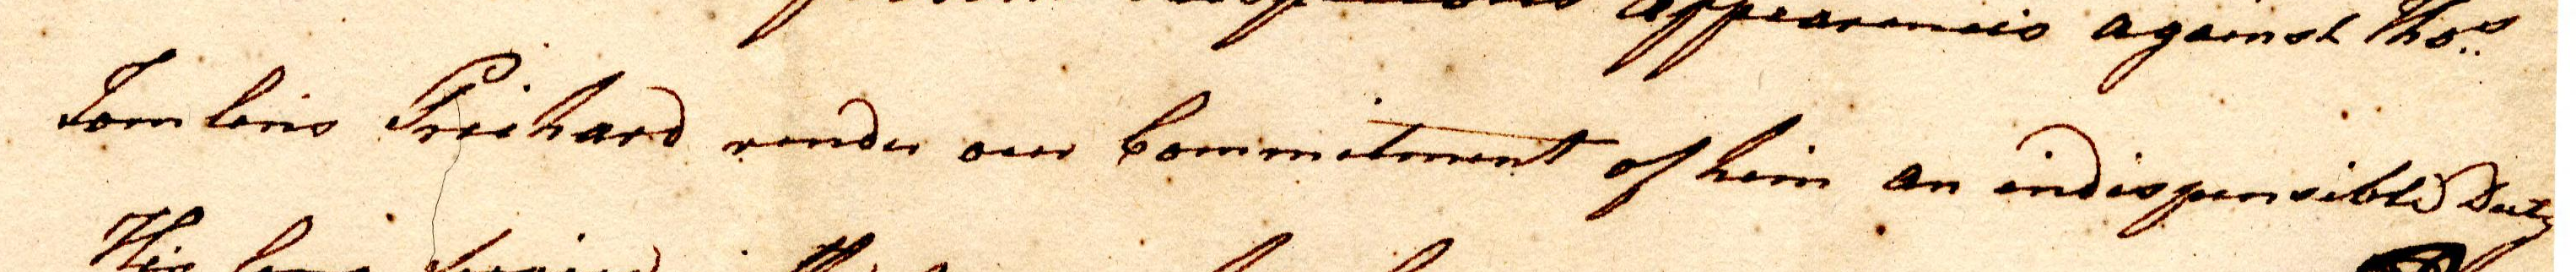Tomkins Prichard render our Commitment of him, an indispensible Duty
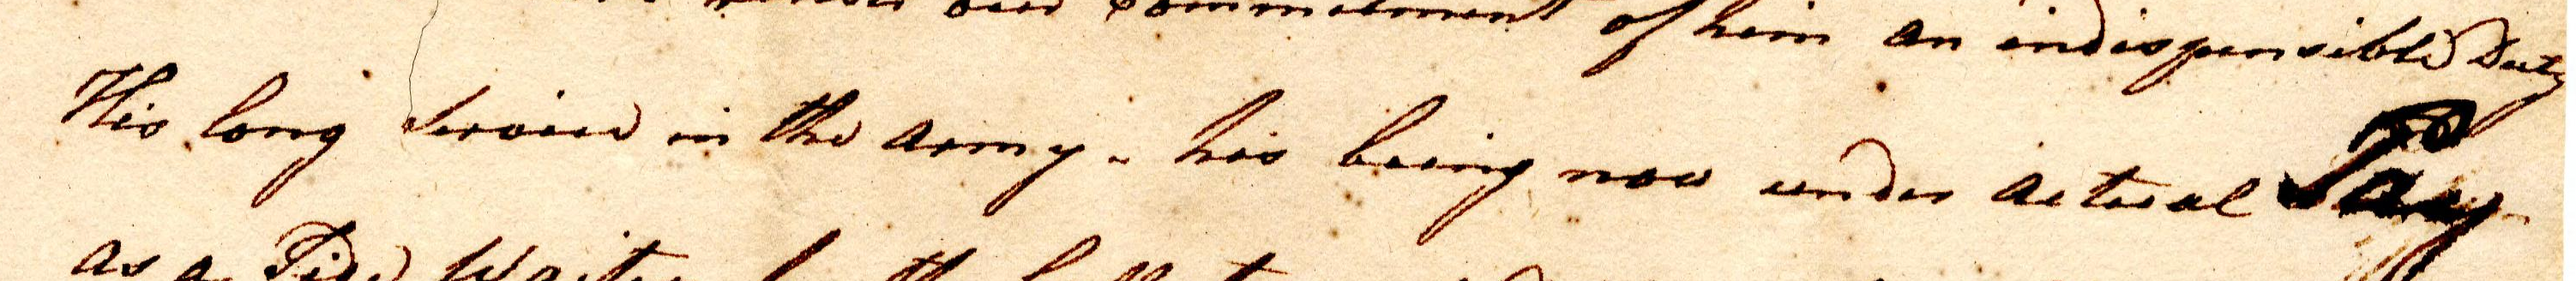his long service in the army, his being now under actual Say
